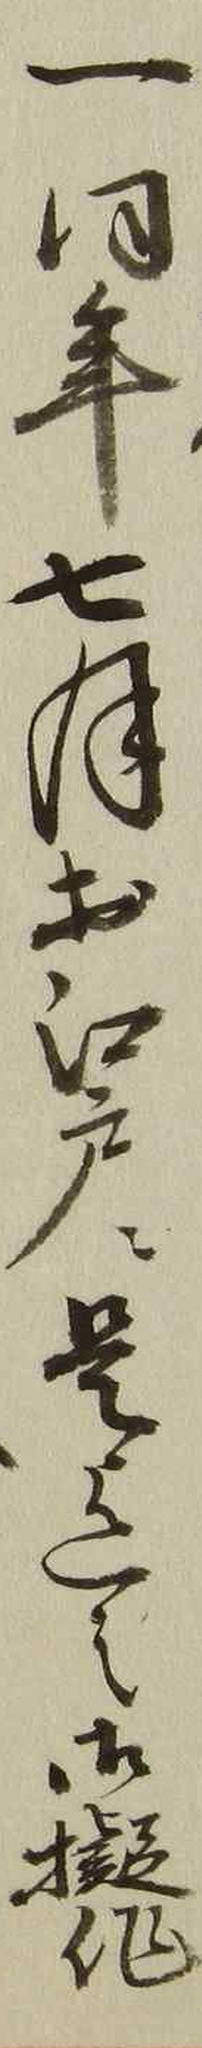一七月同年於江戸ニ是迄之御擬作
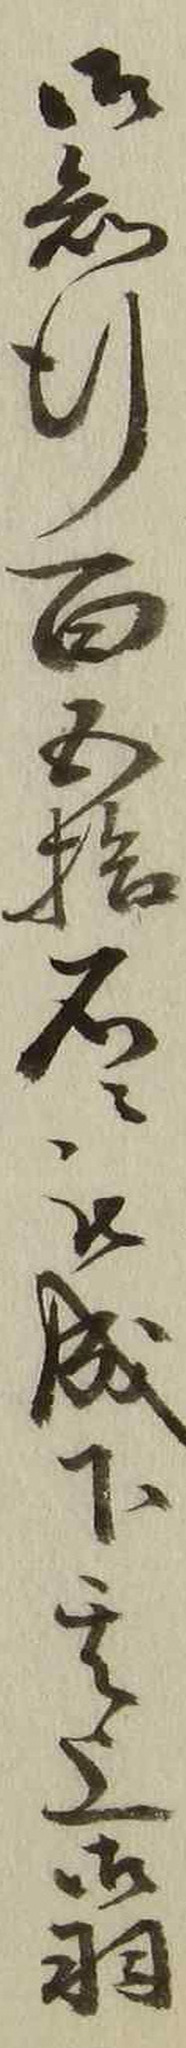御知行百五拾石ニ被成下其上御羽
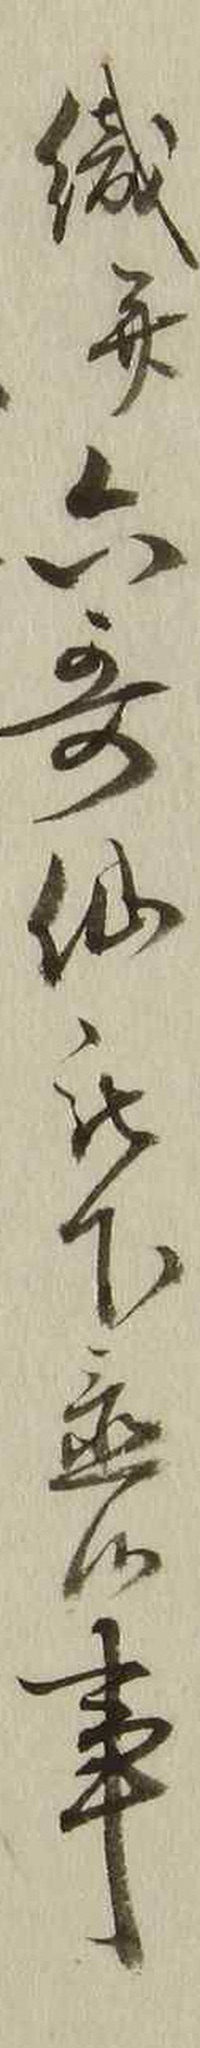織并六歌仙被下置候事
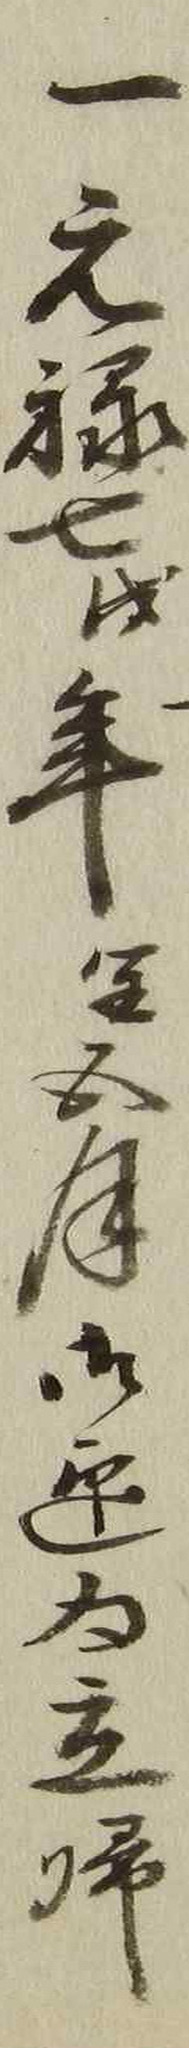一元禄七戌年閏五月御迎為立帰
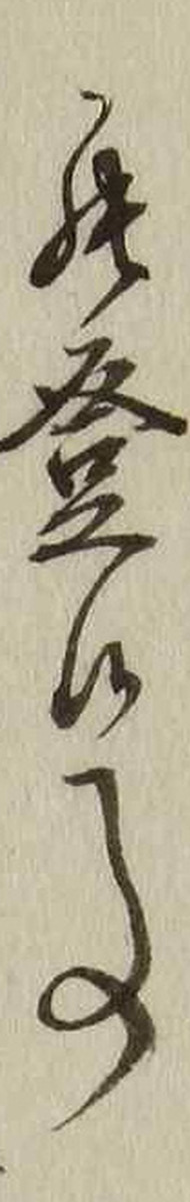罷登候事
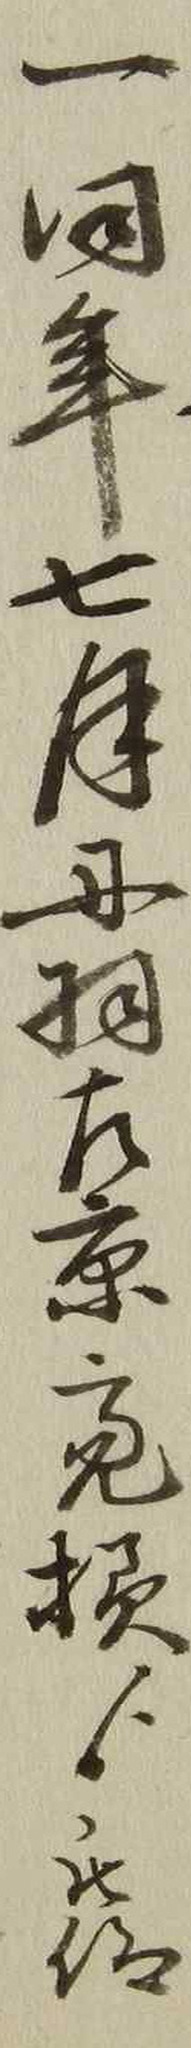一同年七月丹羽左京亮様ゟ被仰
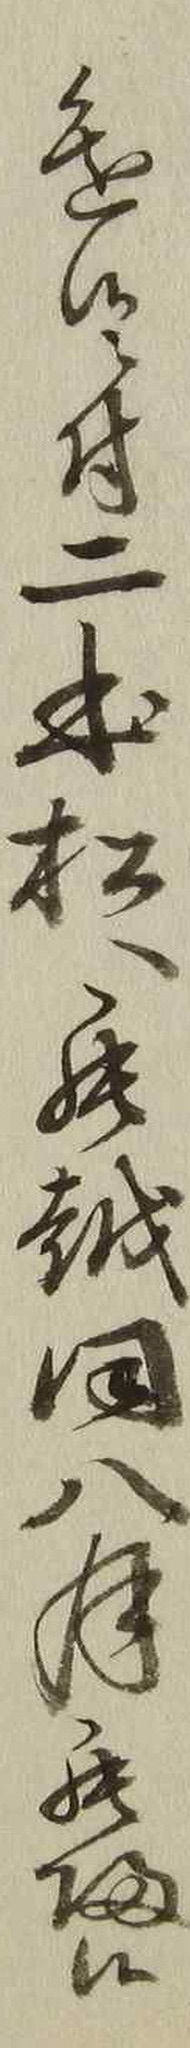遣候ニ付二本松ヘ罷越同八月罷帰候
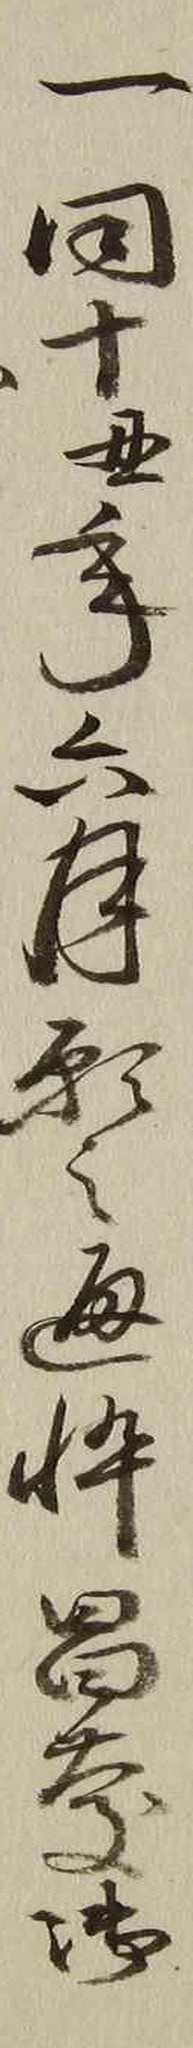一同十丑年六月願之通忰昌慶御
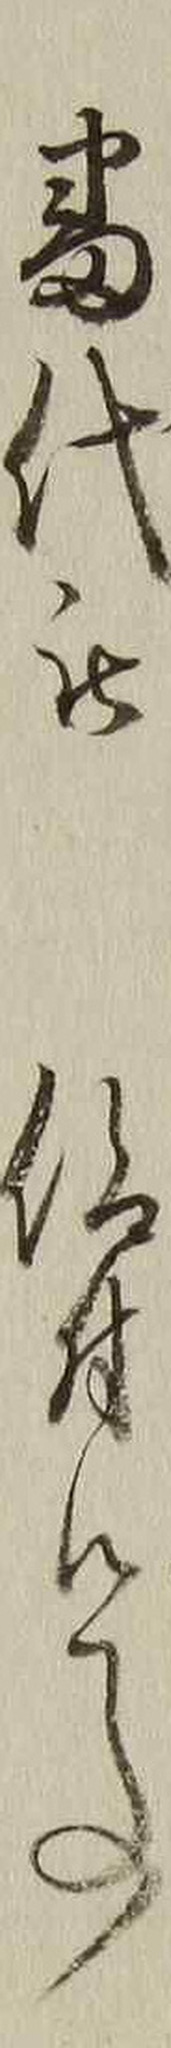番代被仰付候事
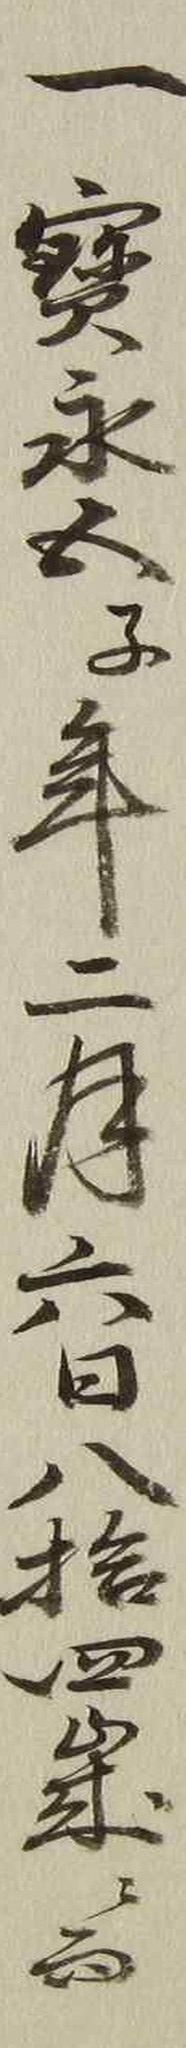一宝永五子年二月六日八拾四歳ニ而
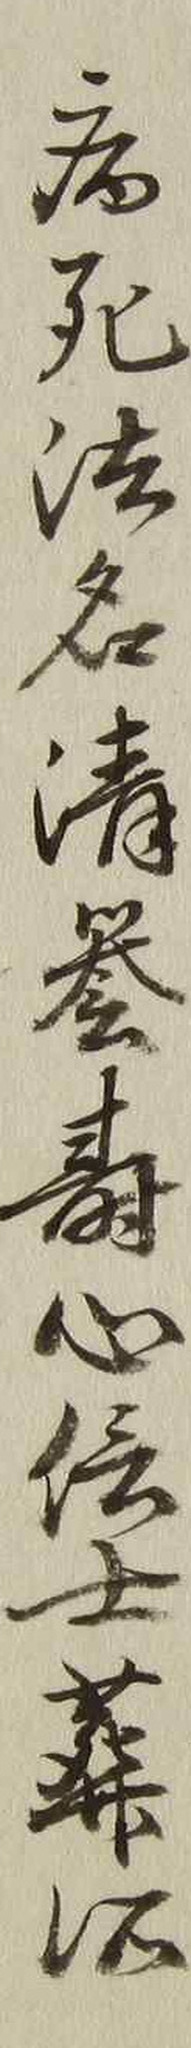病死法名清誉壽心信士葬所
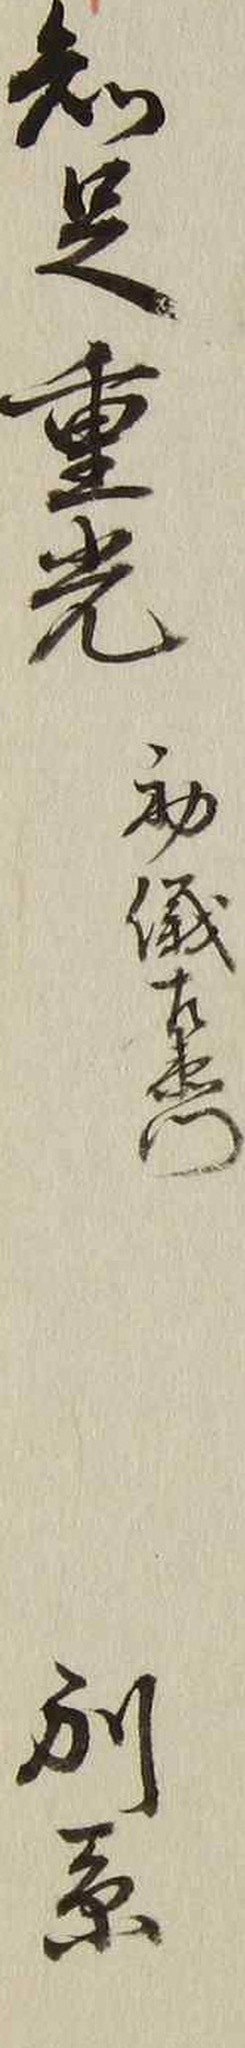知足重光初儀左衛門別系
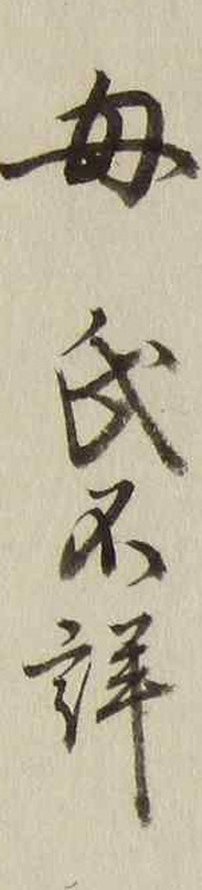母氏不詳

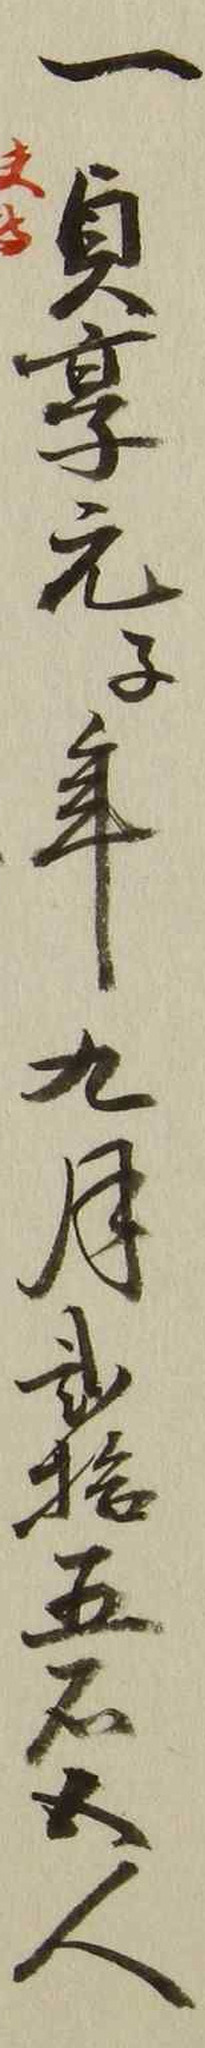一貞享元子年九月弐拾五石五人
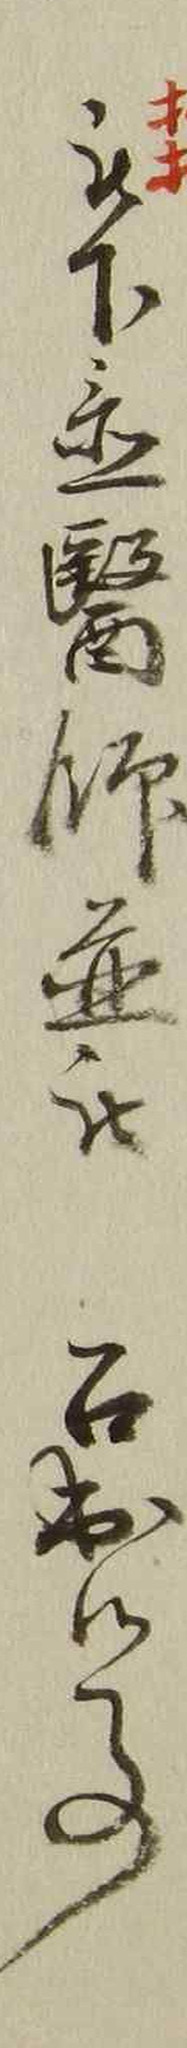被下置医師並被召出候事
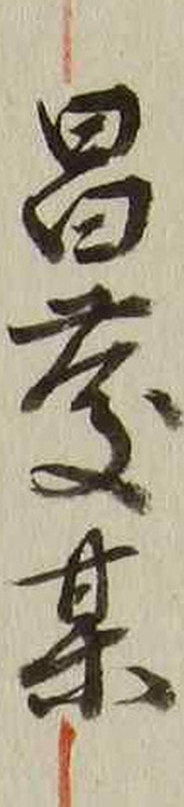昌慶某
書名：諸士系譜　巻之31　い之部31
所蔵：会津若松市立会津図書館
